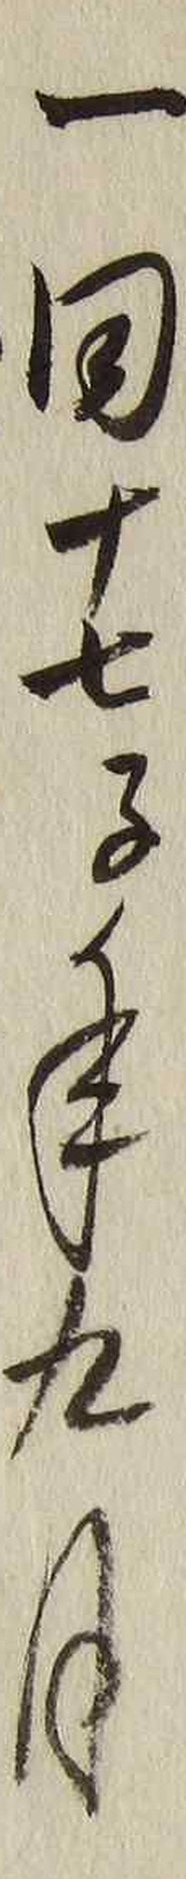一同十七子年九月
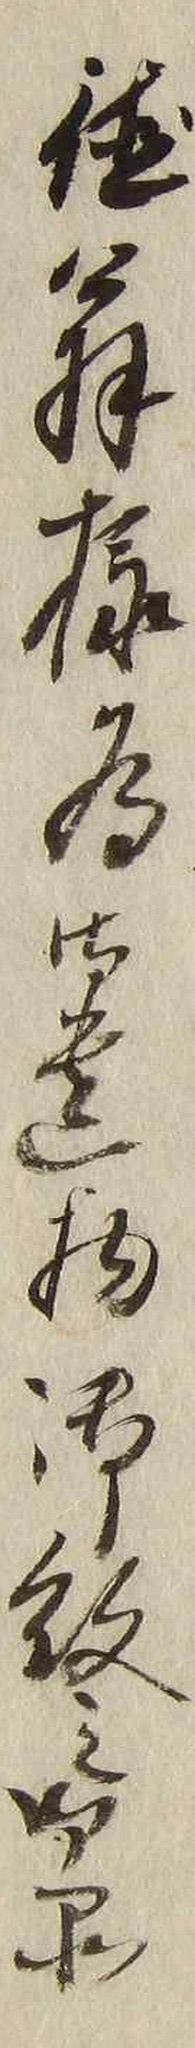徳翁様為御遺物御紋之御品
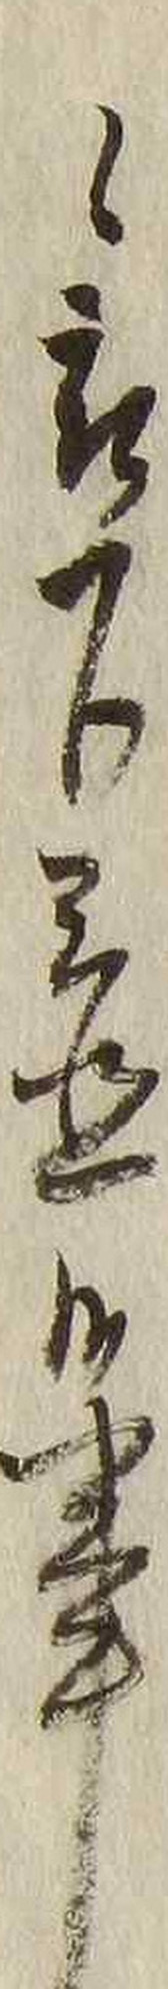々被下置候事

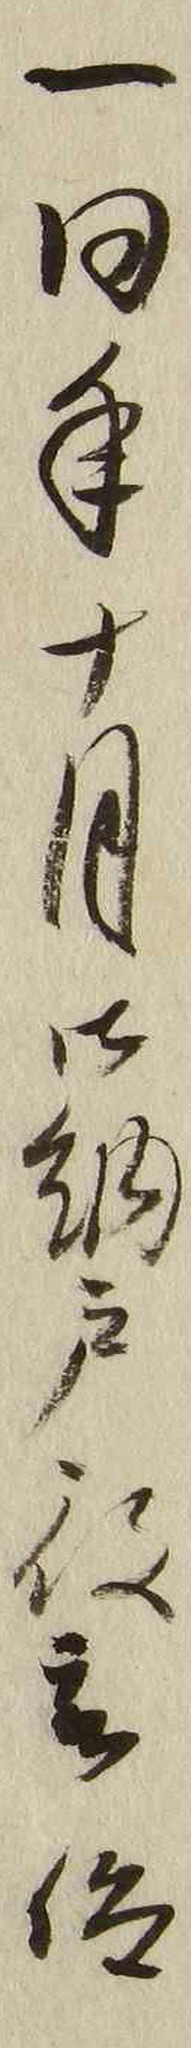一同年十月御納戸役被仰
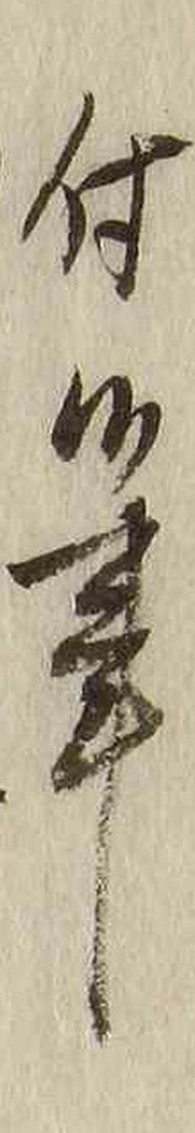付候事
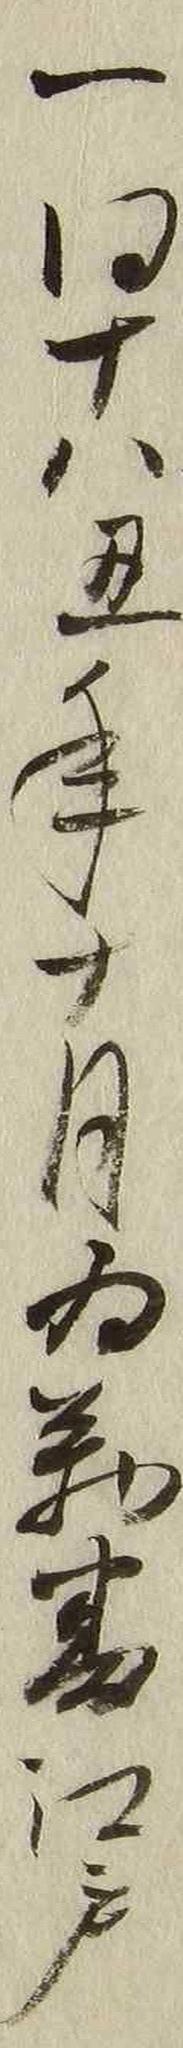一同十八丑年十月為勤番江戸
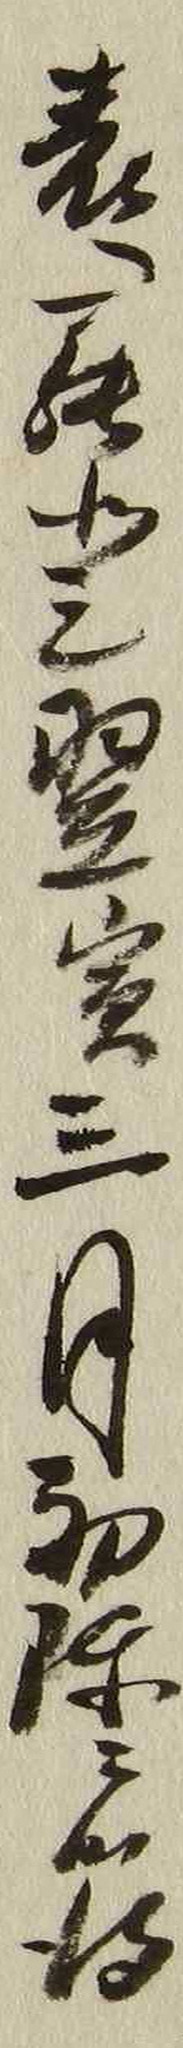表へ罷登翌寅三月初陣ニ候得
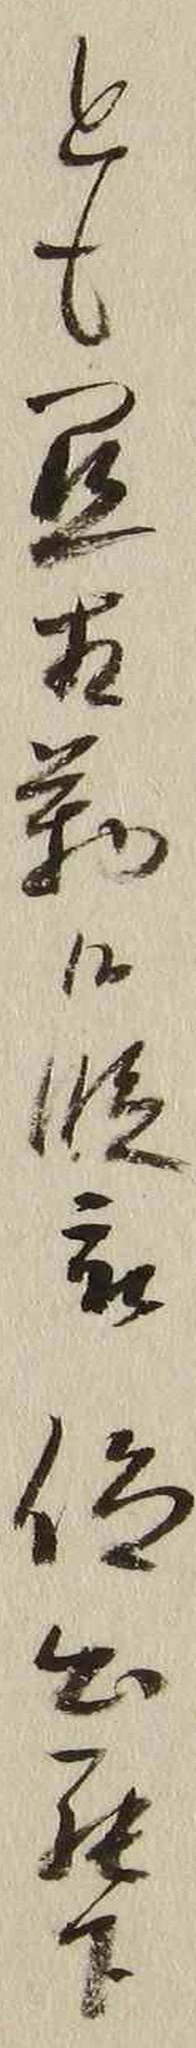とも宜相勤候段被仰出罷下
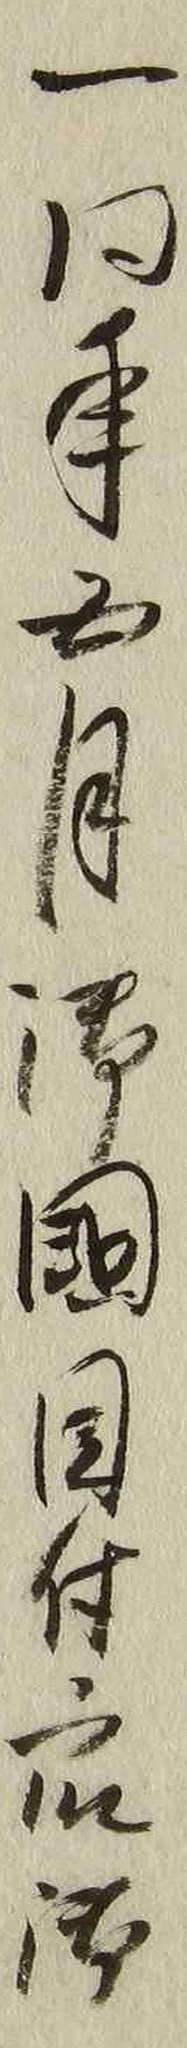一同年五月御国目付衆御
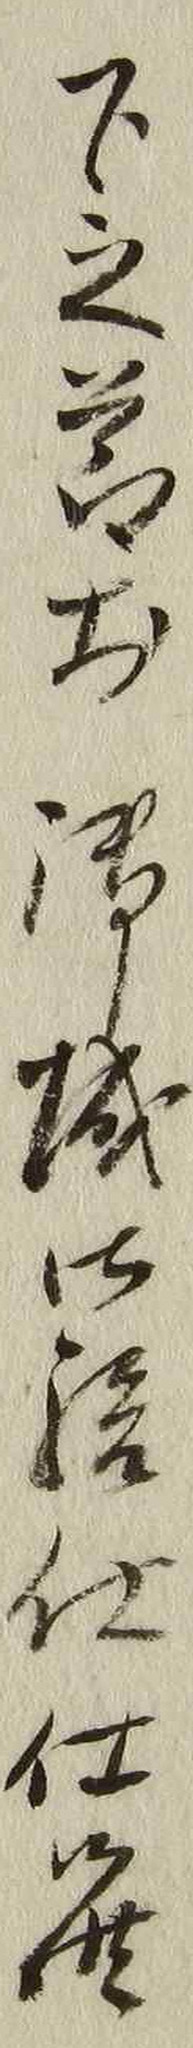下之節於御城御詰仕仕御供
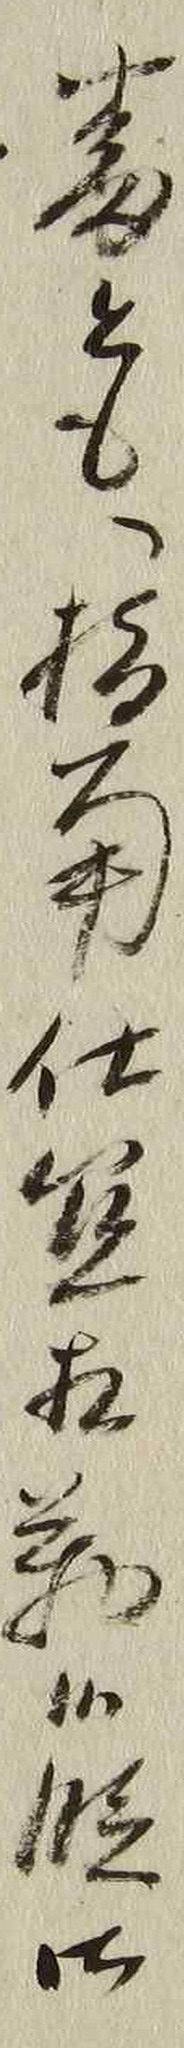番ともへ指南仕宜相勤候段御
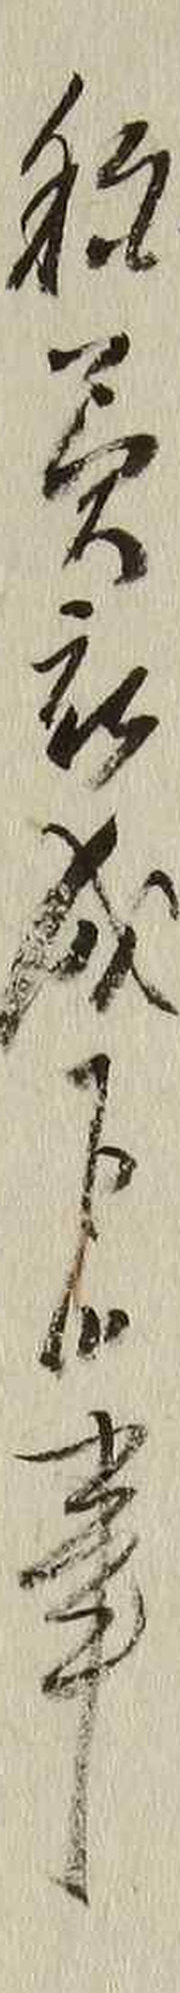称美被成下候事
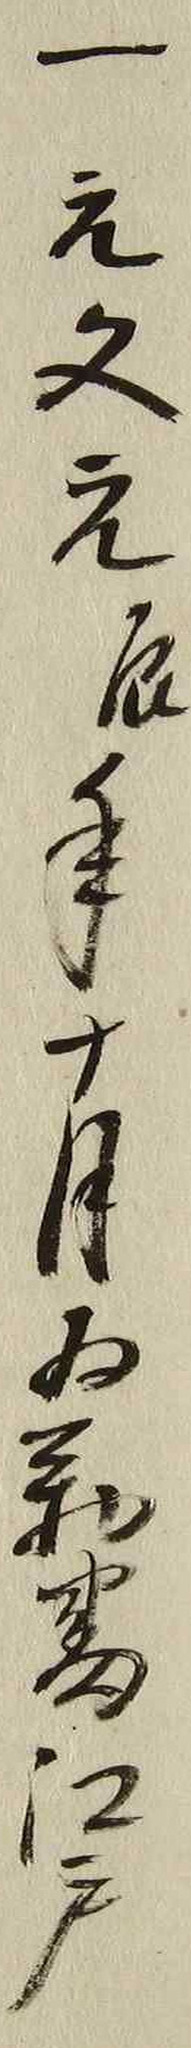一元文元辰年十月為勤番江戸
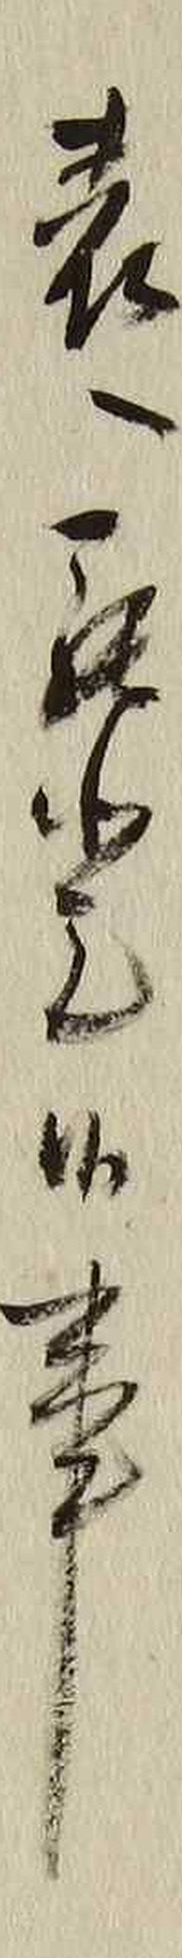表へ罷登候事
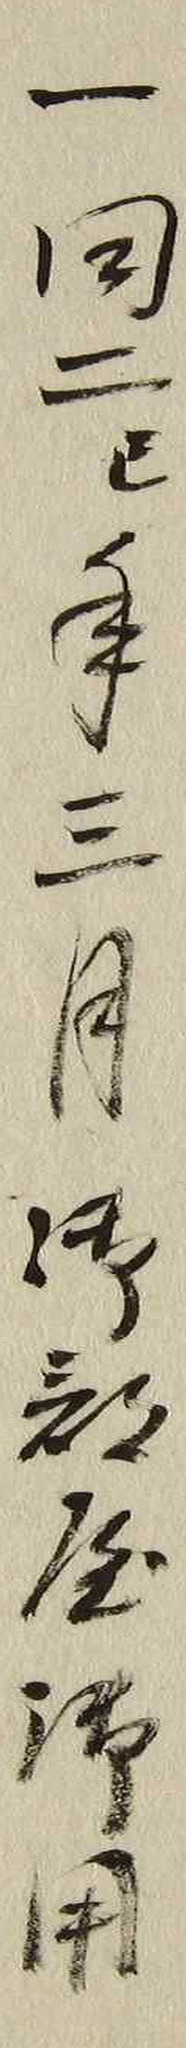一同二巳年三月御部屋御用
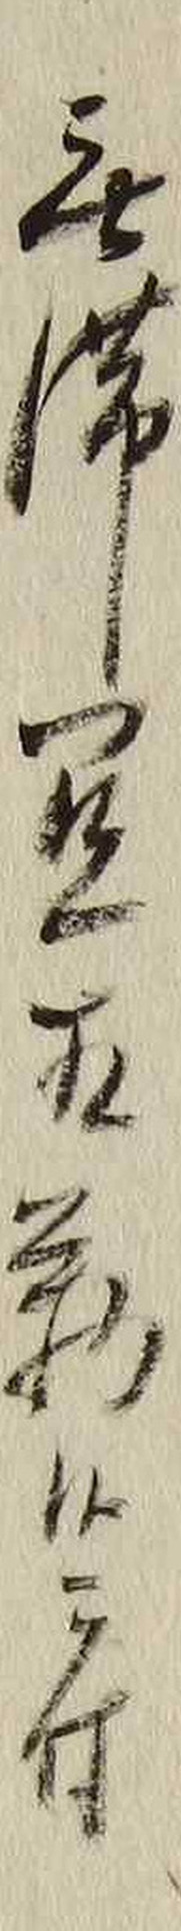無滞宜相勤候ニ付
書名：諸士系譜　巻之355　す之部5
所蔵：会津若松市立会津図書館
